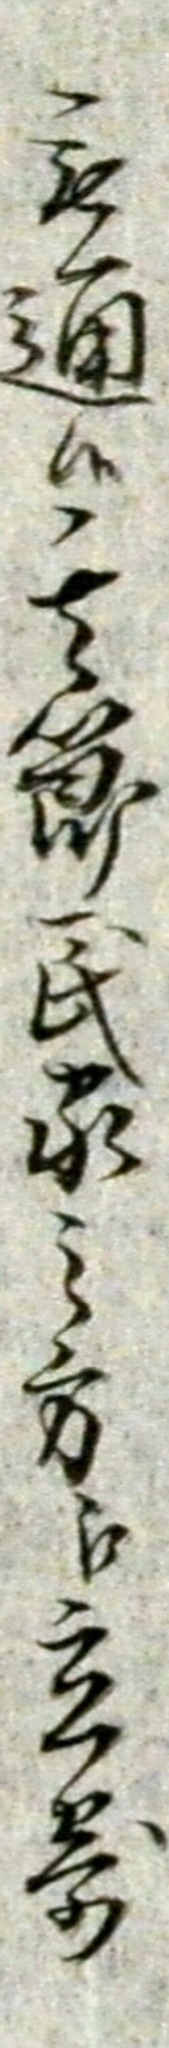被通候其節へ氏家之方江立寄
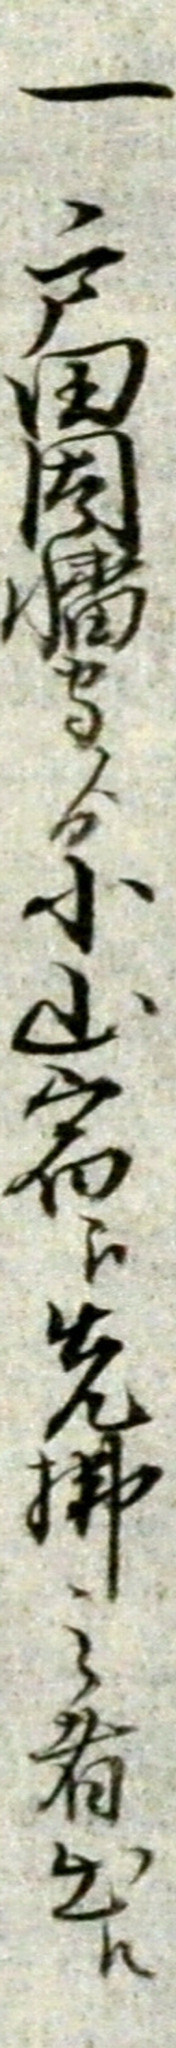一戸田因幡守ゟ小山宿江先払之者出ㇽ
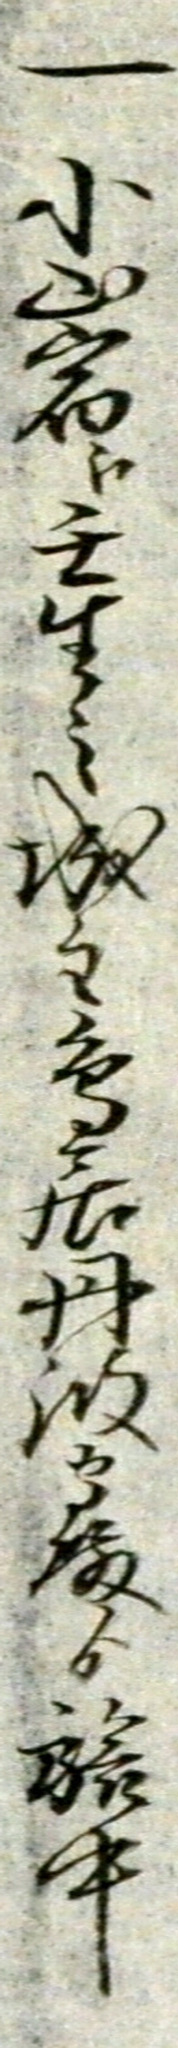一小山宿江壬生之城主鳥居丹波守殿ゟ旅中
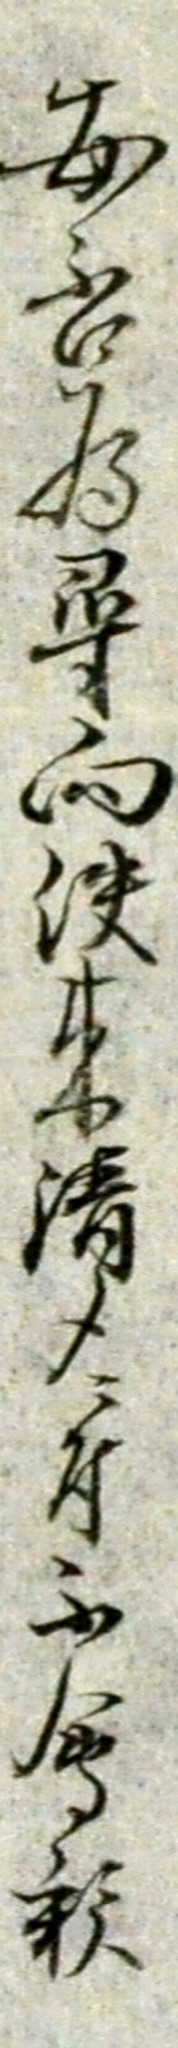安否為尋向使来清メ二付不会釈
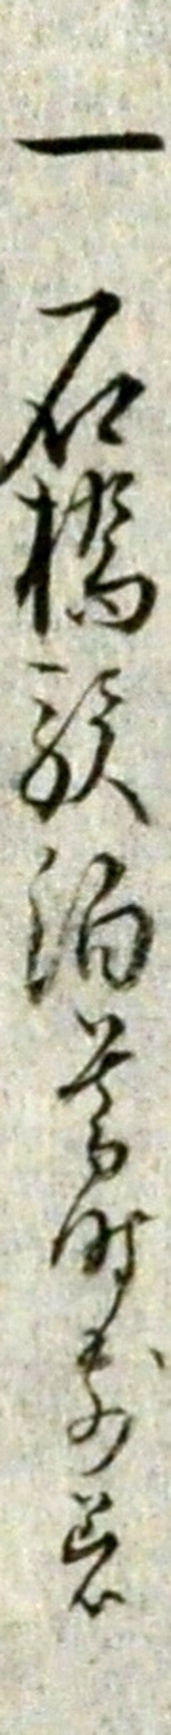一石橋駅泊暮時前着
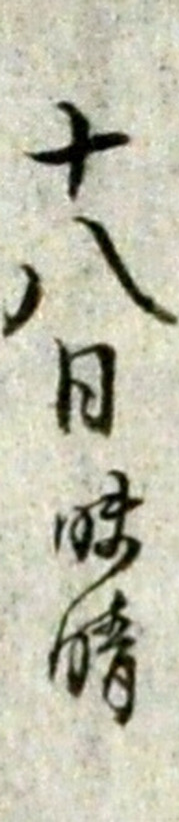十八日快晴
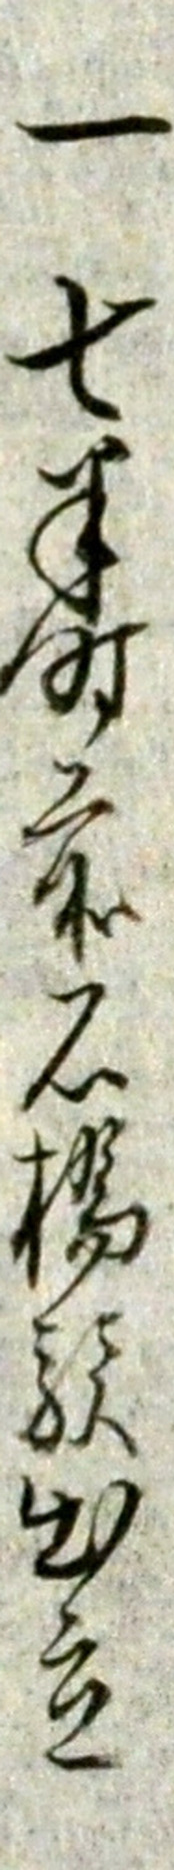一七半時前石橋駅出立
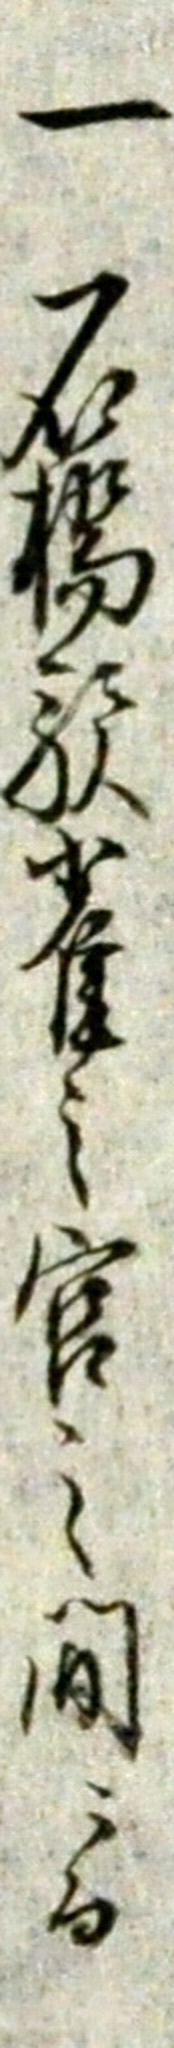一石橋駅雀之宮之間ニ而
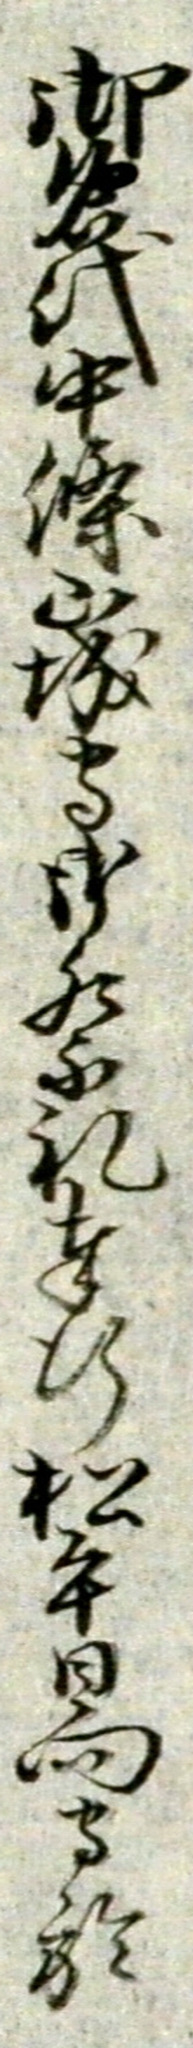御名代中條山城守御祭礼奉行松平日向守於
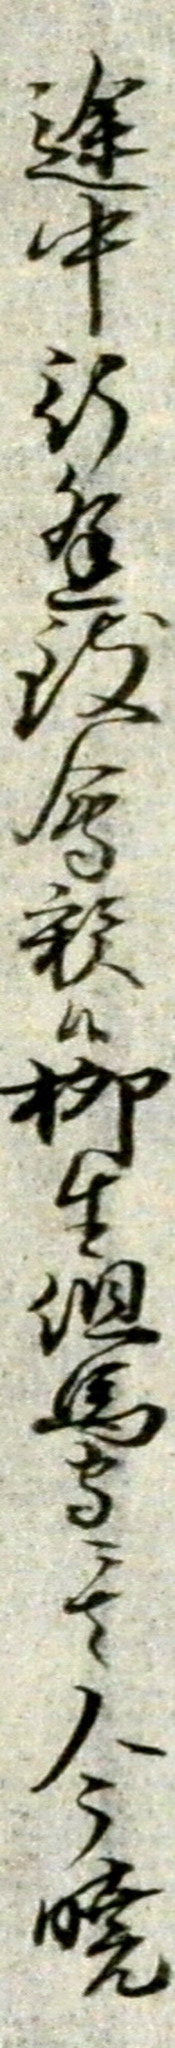途中行逢致会釈候柳生但馬守ニ者今暁
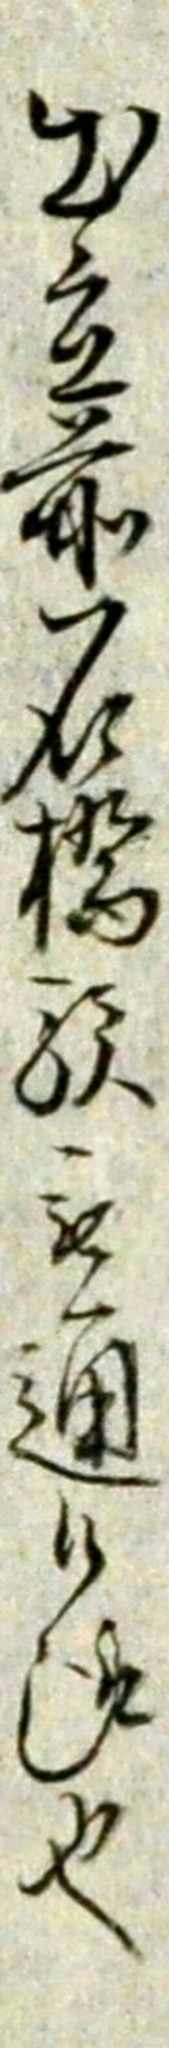出立前石橋駅被通候趣也
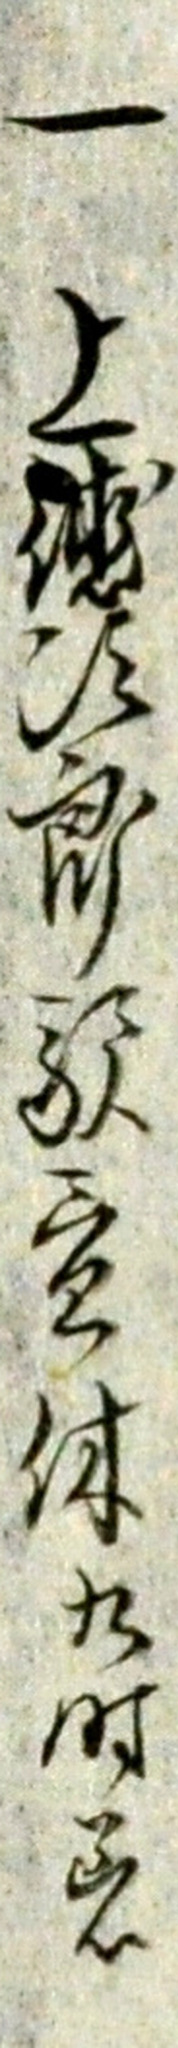一上徳次郎駅昼休九時着
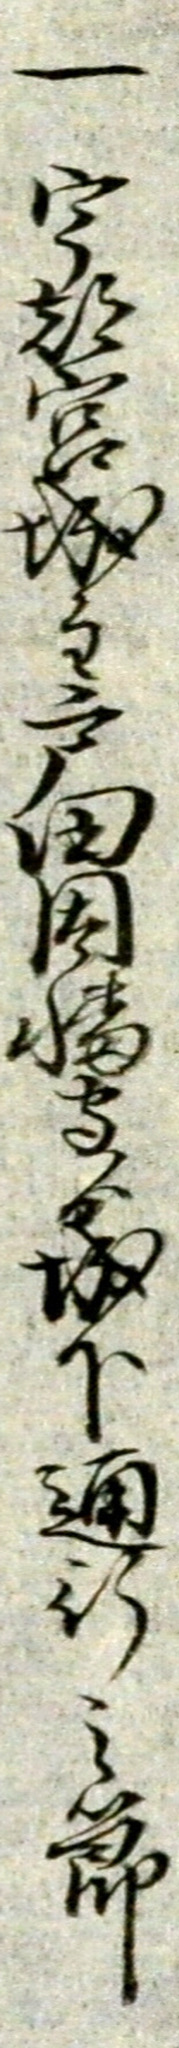一宇都宮城主戸田因幡守ゟ城下通行之節
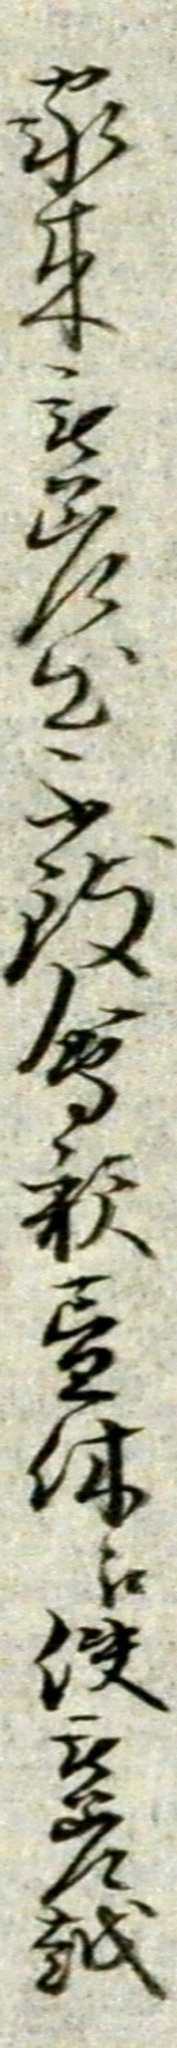家来被差出不致会釈昼休江使被差越
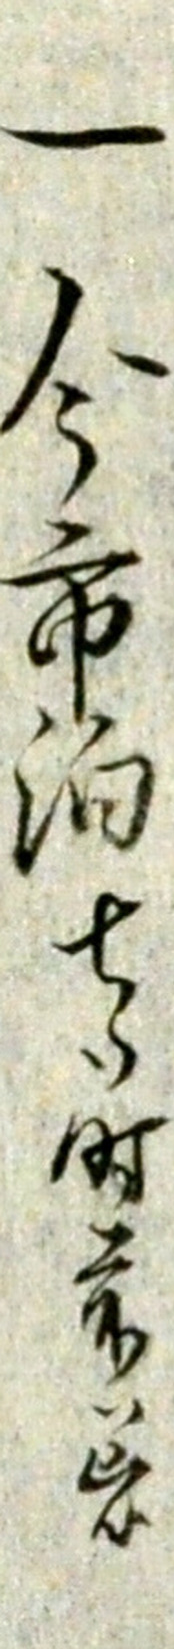一今市泊七ツ時前着
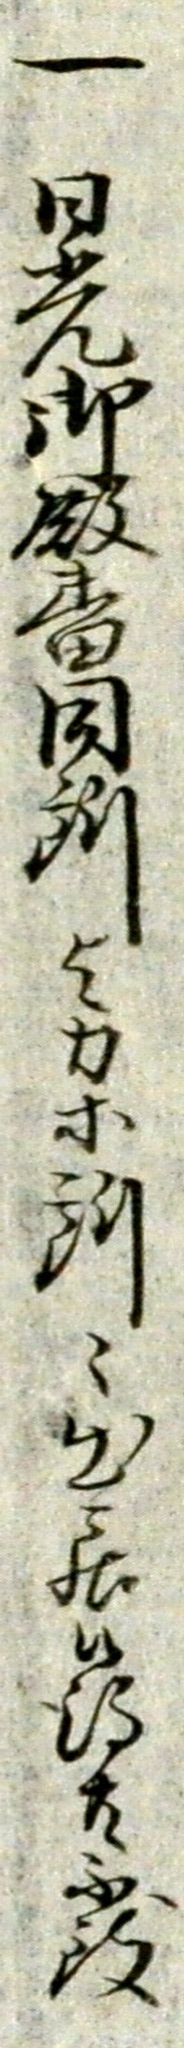一日光御殿番同所与力等所々出居候得共不致
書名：日光御名代相勤候節ノ留
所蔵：伊那市立高遠町図書館・合同会社AMANE
